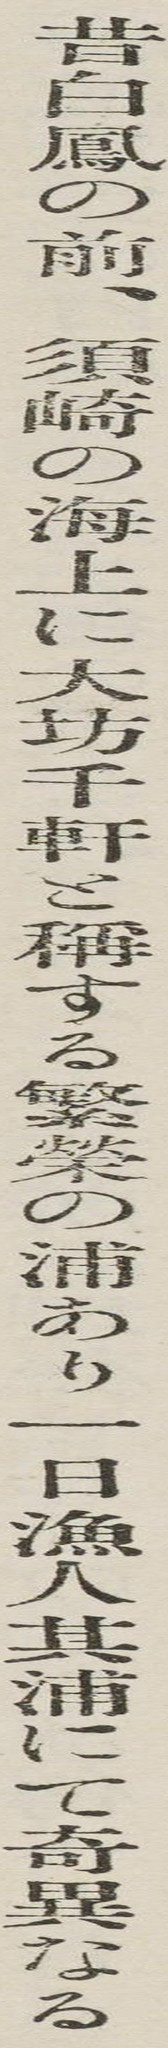昔白鳳の前、須崎の海上に大坊千軒と称する繁栄の浦あり一日漁人其浦にて奇異なる
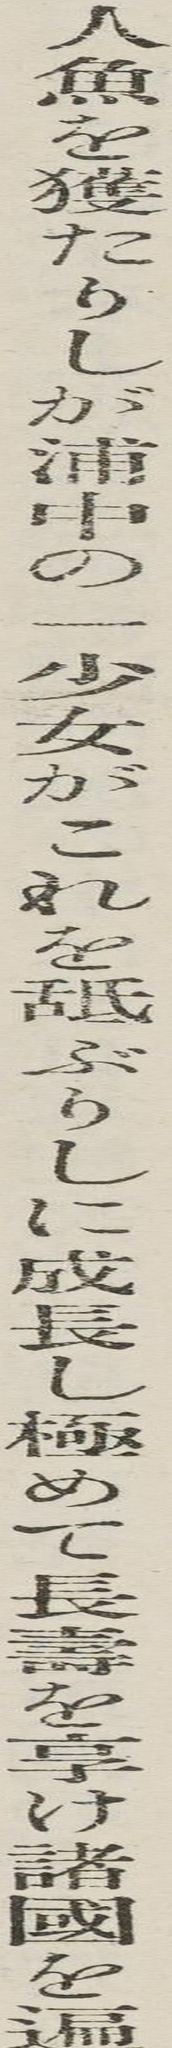人魚を獲たりしが浦中の一少女がこれを舐ぶりしに成長し極めて長寿を享け諸国を遍
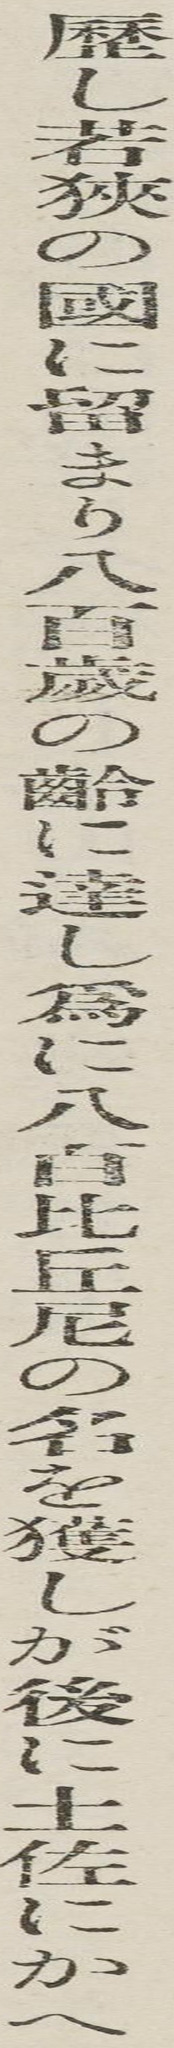歴し若狭の国に留まり八百歳の齢に達し為に八百比丘尼の名を獲しが後に土佐にかへ
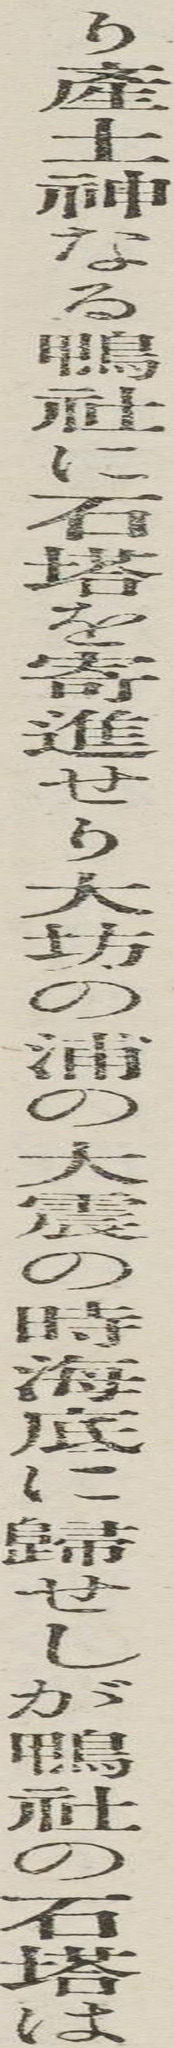り産土神なる鴨社に石塔を寄進せり大坊の浦の大震の時海底に帰せしが鴨社の石塔は
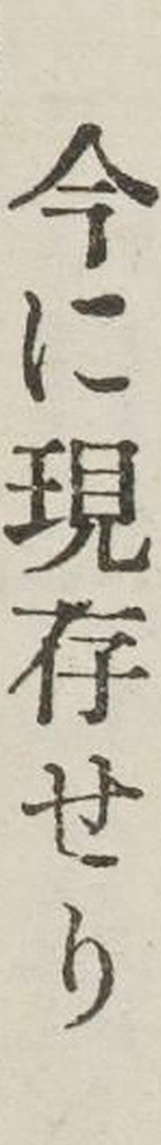今に現存せり
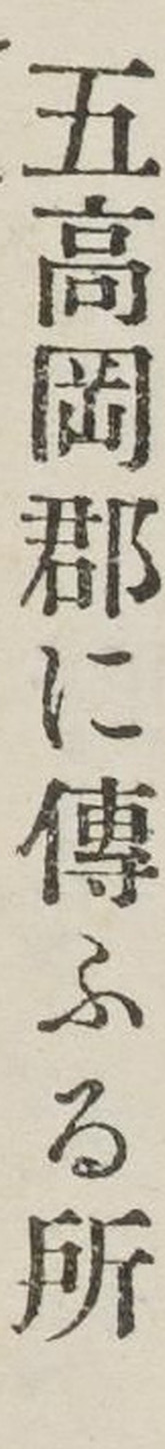㈤高岡郡に伝ふる所

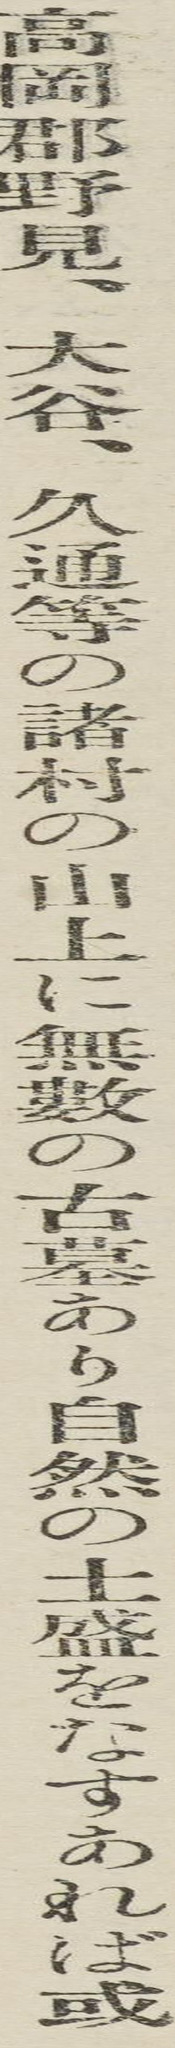高岡郡野見、大谷、久通等の諸村の山上に無数の古墓あり自然の土盛をなすあれば或
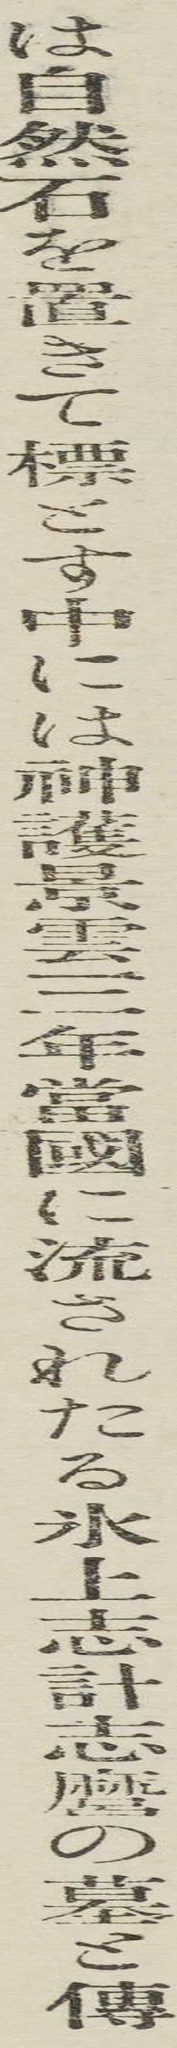は自然石を置きて標とす中には神護景雲三年当国に流されたる氷上志計志麿の墓と伝
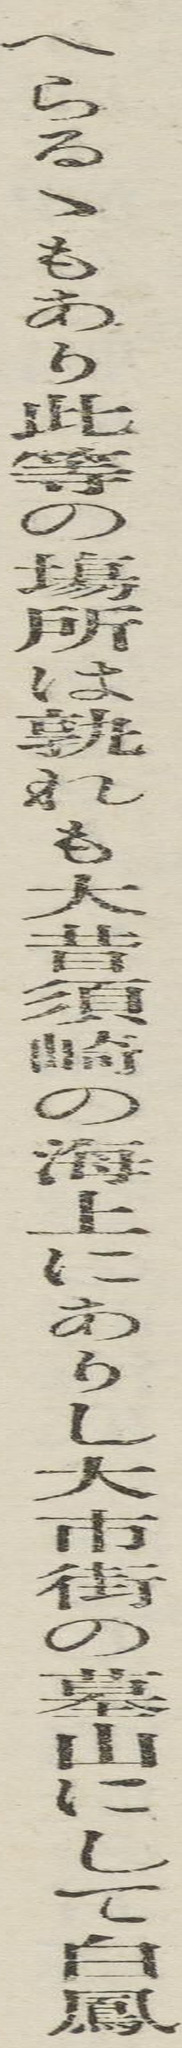へらるゝもあり此等の場所は孰れも大昔須崎の海上にありし大市街の墓山にして白鳳
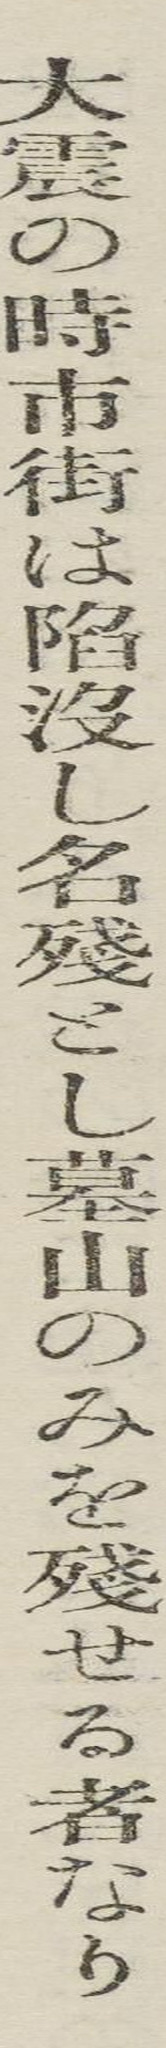大震の時市街は陥没し名残とし墓山のみを残せる者なり
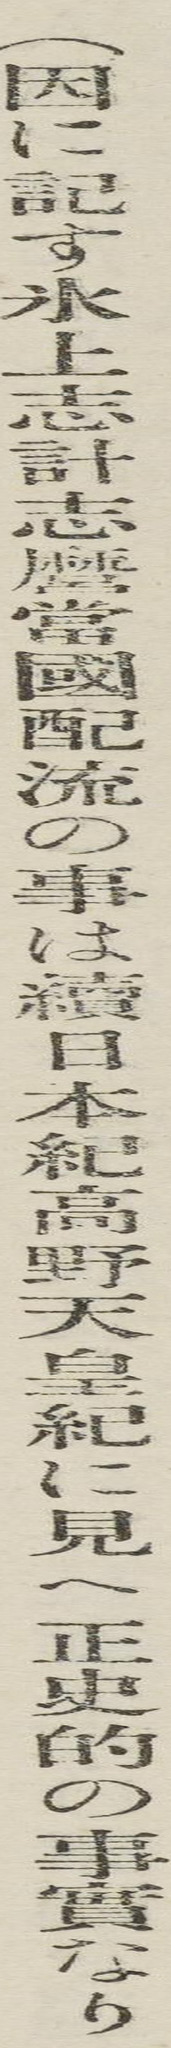（因に記す氷上志計志麿当国配流の事は続日本紀高野天皇紀に見へ正史的の事実なり
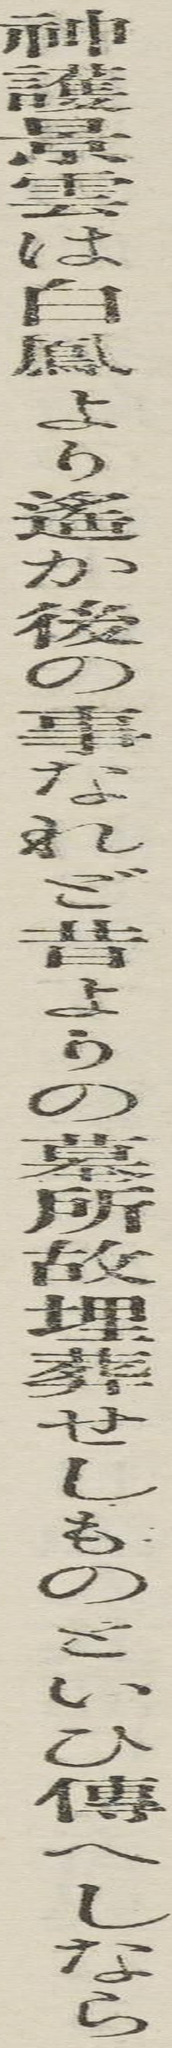神護景雲は白鳳より遙か後の事なれど昔よりの墓所故埋葬せしものといひ伝へしなら
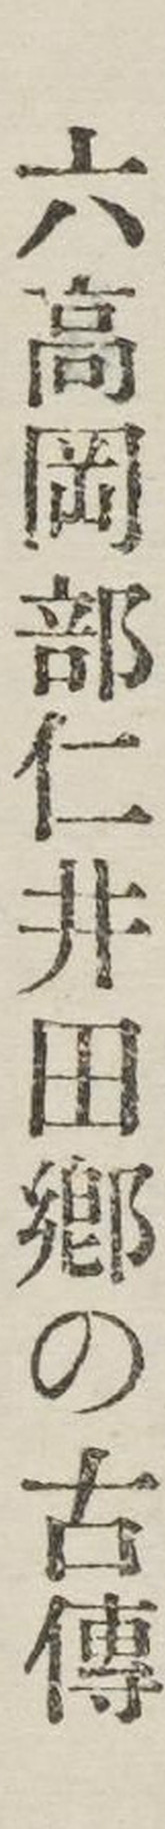㈥高岡郡仁井田郷の古伝
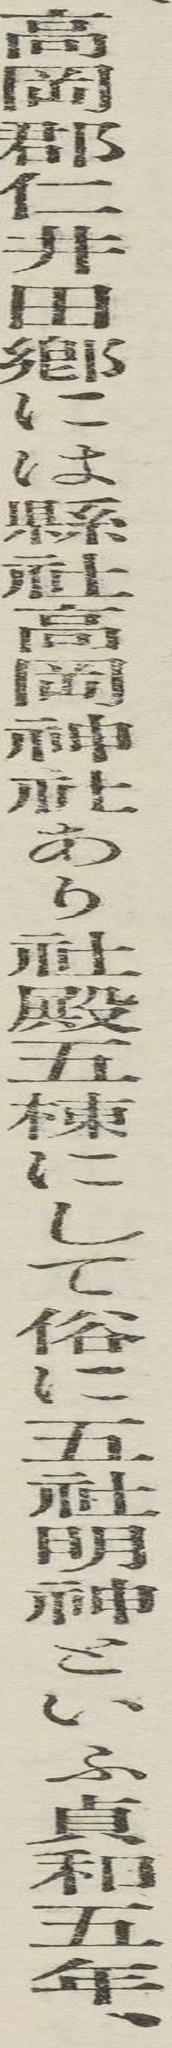高岡郡仁井田郷には縣社高岡神社あり社殿五棟にして俗に五社明神といふ貞和五年、
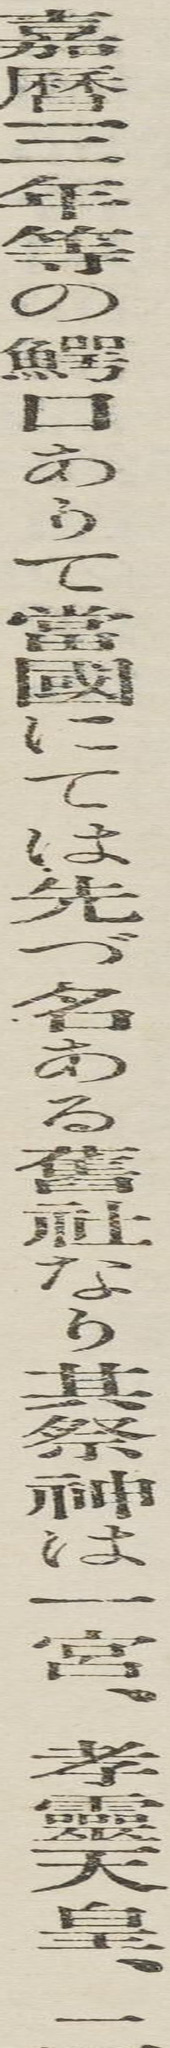嘉暦三年等の鰐口ありて当国にては先づ名ある旧社なり其祭神は一宮、孝霊天皇、二
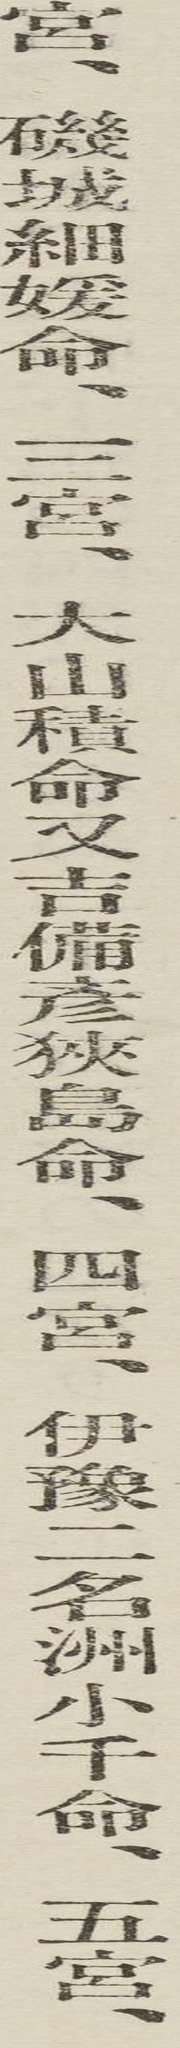宮、磯城細媛命、三宮、大山積命又吉備彦狭島命、四宮、伊予二名洲小千命、五宮、
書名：土佐古今ノ地震
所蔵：東京大学地震研究所図書室 Earthquake Research Institute Library, The University of Tokyo, JAPAN
